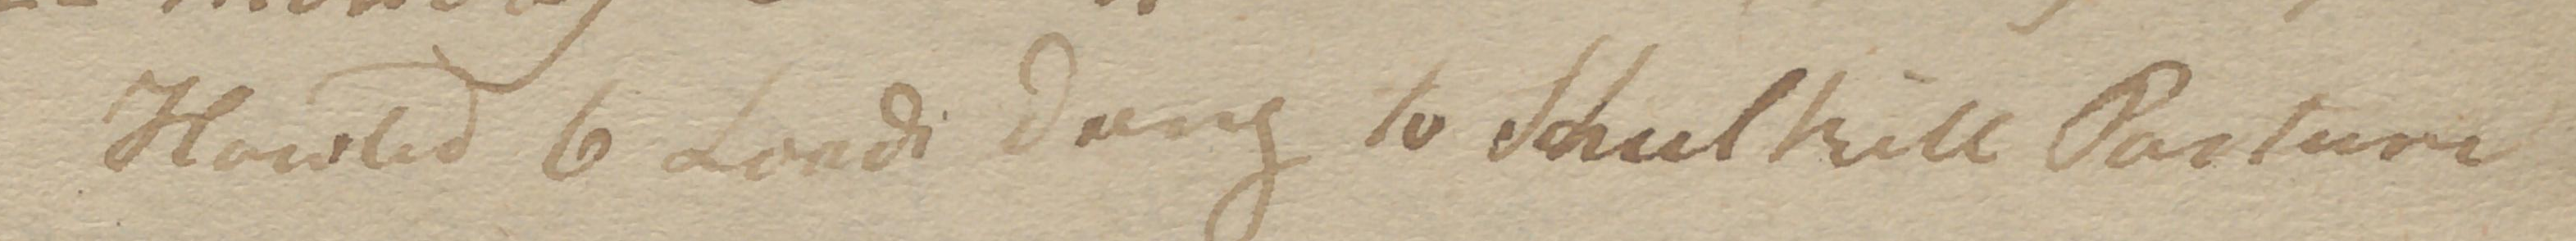Hawled 6 Loads dung to Schulkill Pasture
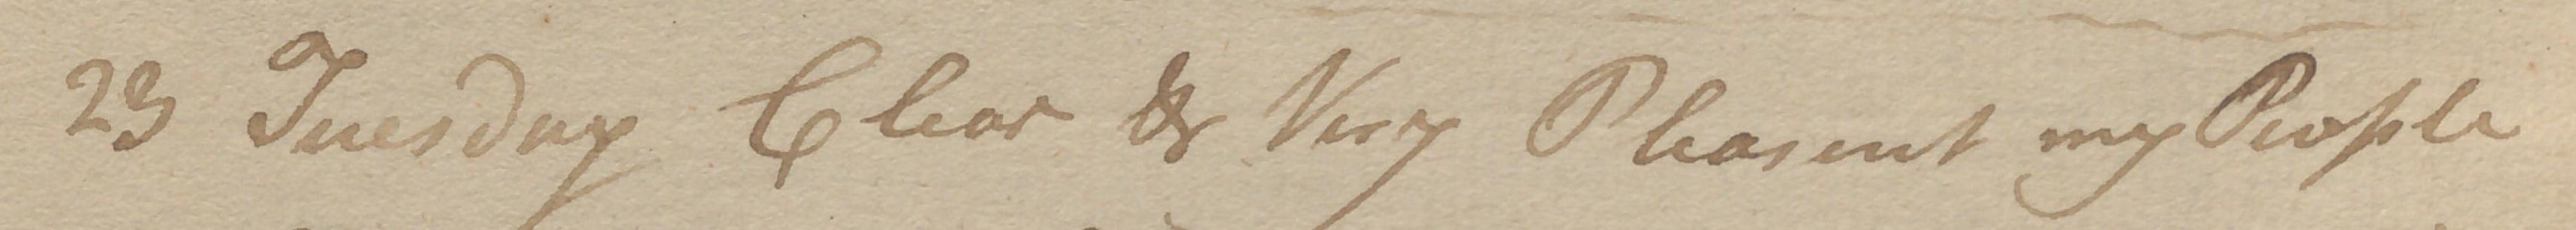23 Tuesday Clear & Very Pleasent my People
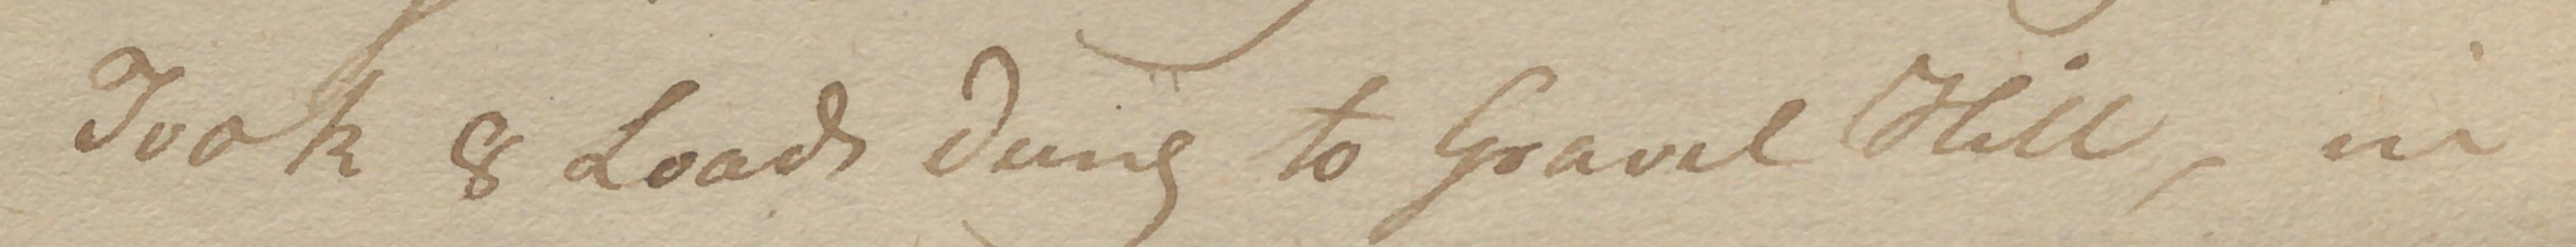Took 8 Loads dung to Gravel Hill, in
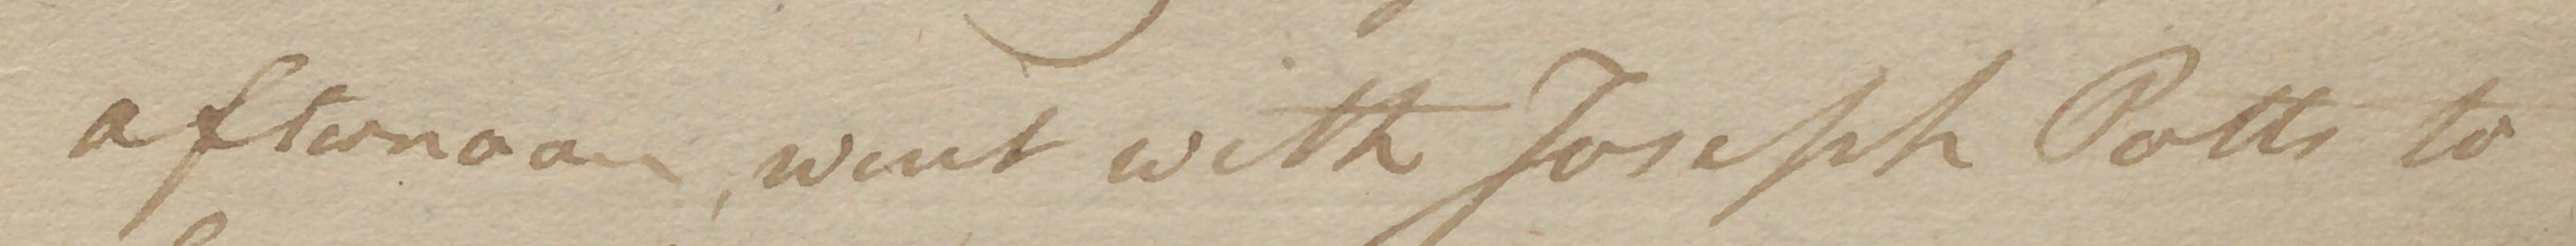afternoon, went with Joseph Potts to
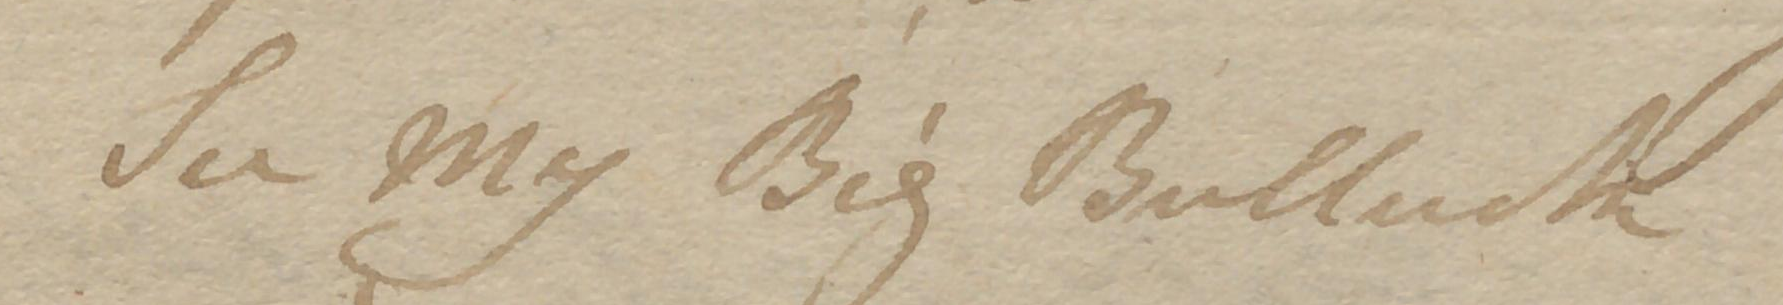see My Big Bulluck
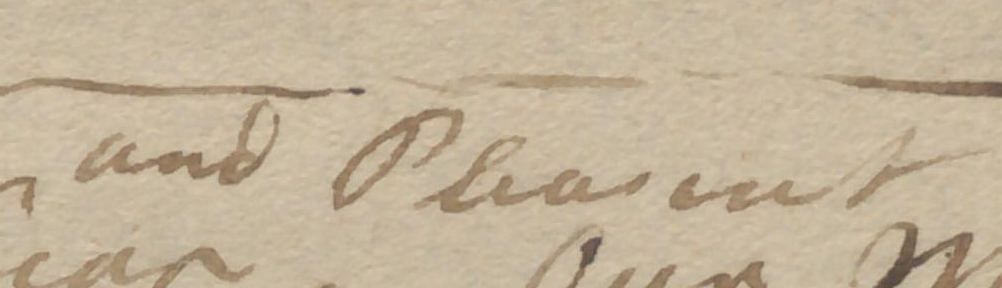and Pleasent
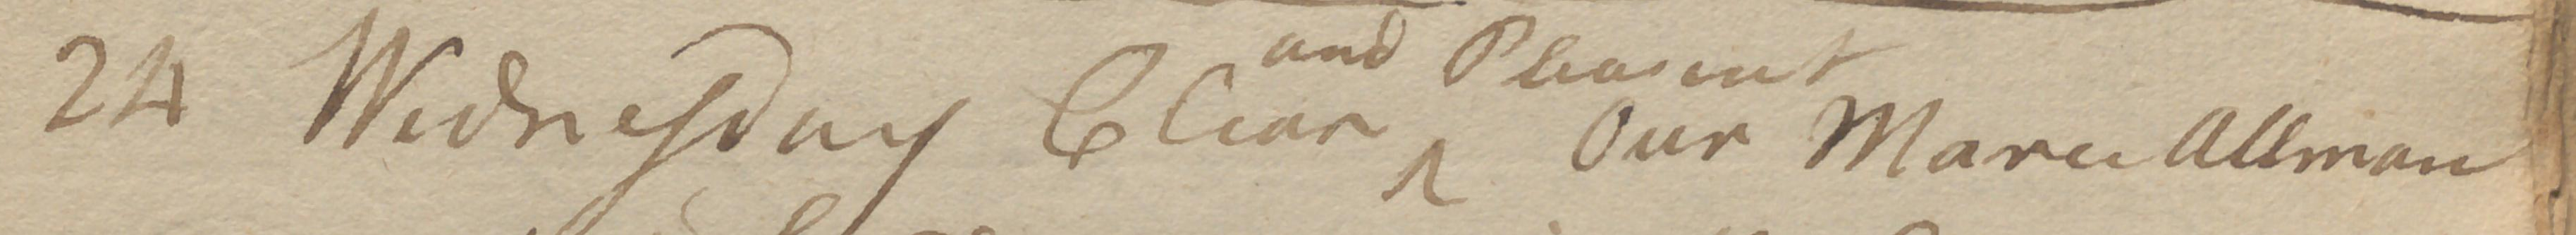24 Wednesday Clear ^ our Maree Allman
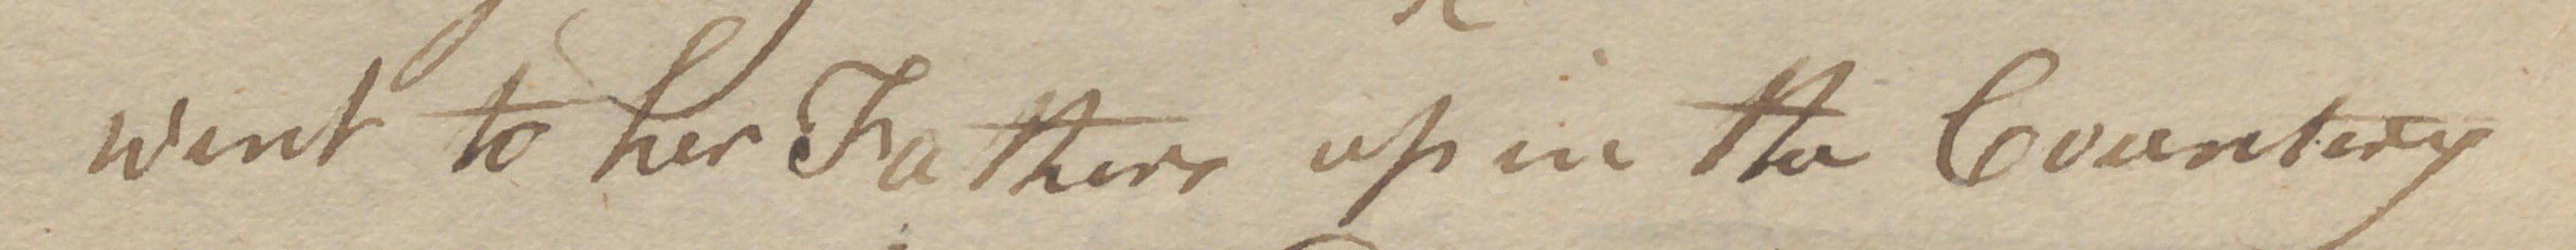went to her Fathers up in the Country
